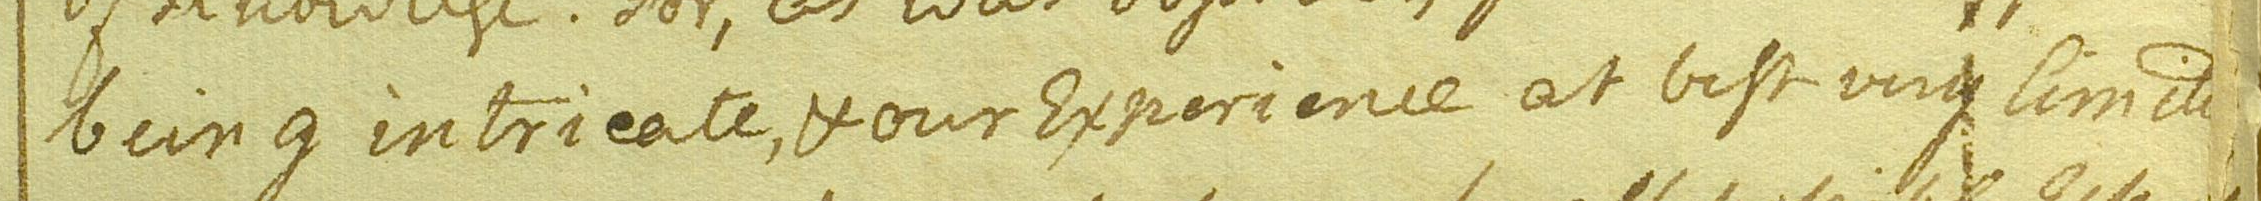being intricate, & our Experience at best very limited
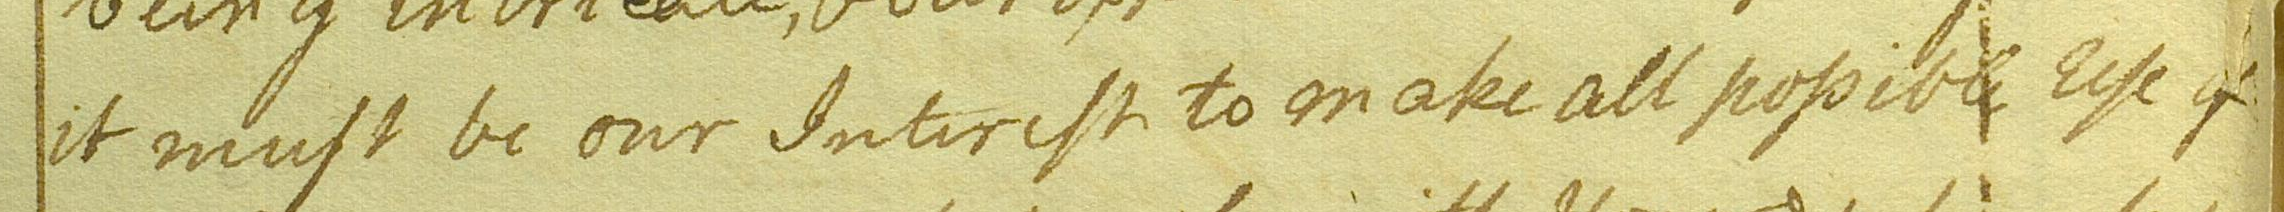it must be our Interest to make all possible use of
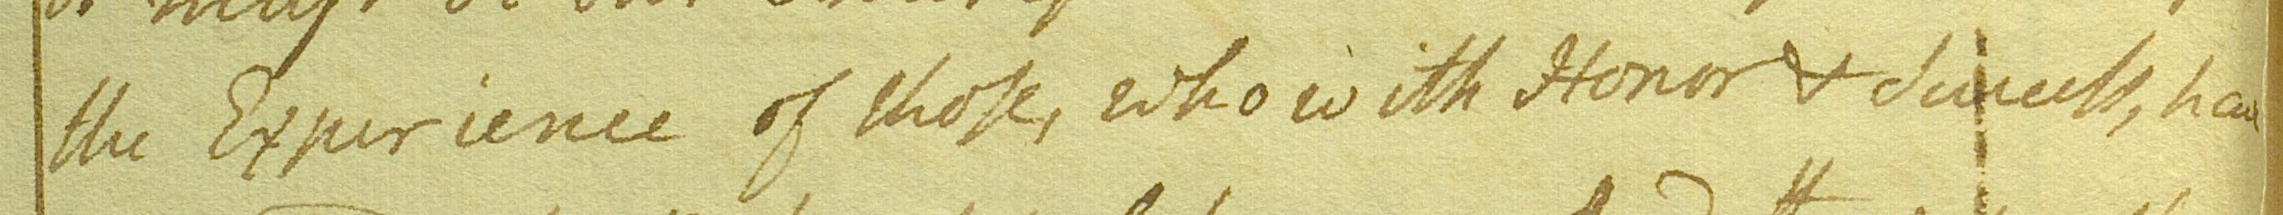the Experience of those, who with Honor & Success, have
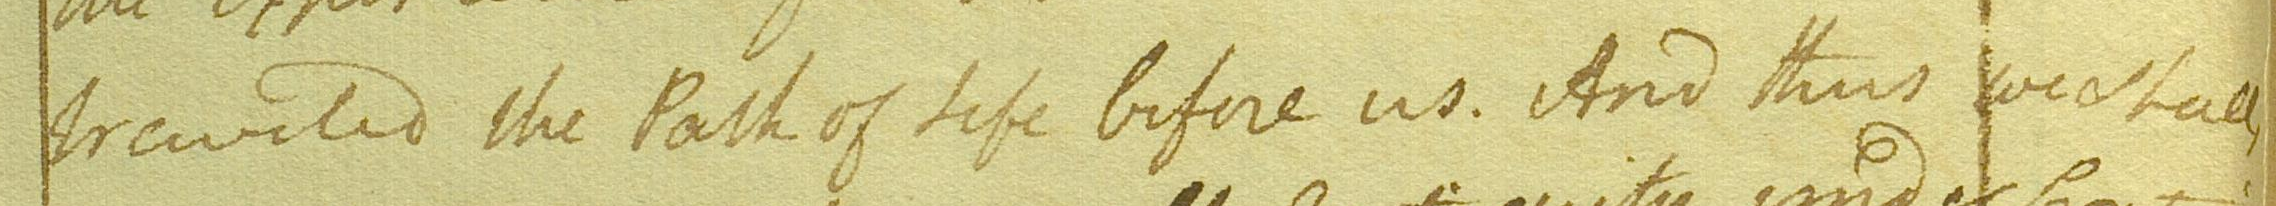traveled the Path of Life before us. And thus we shall,
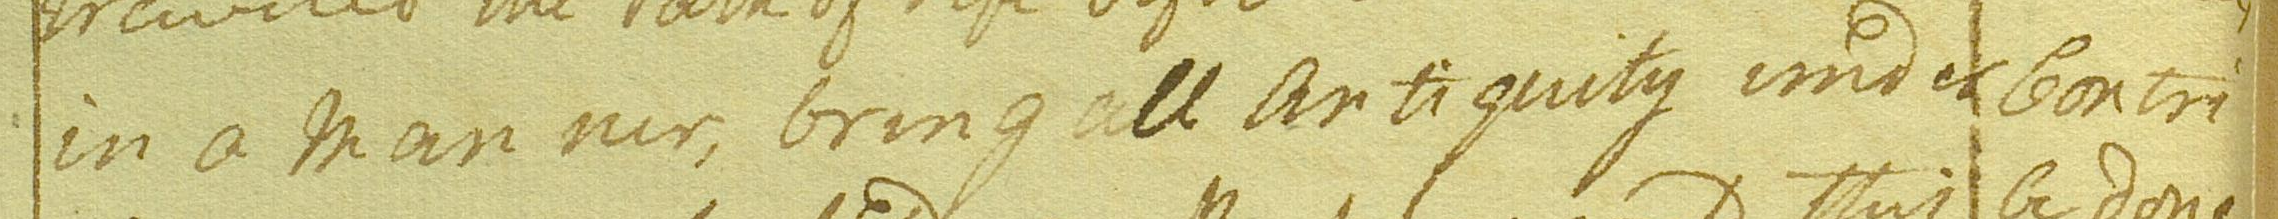in a manner, bring all Antiquity under Contri
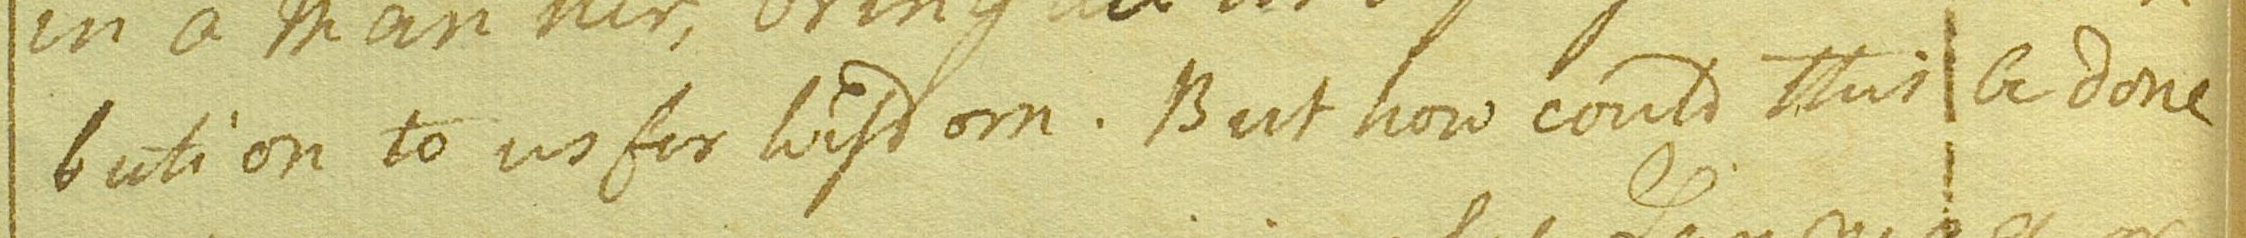bution to us for wisdom. But how could this be done
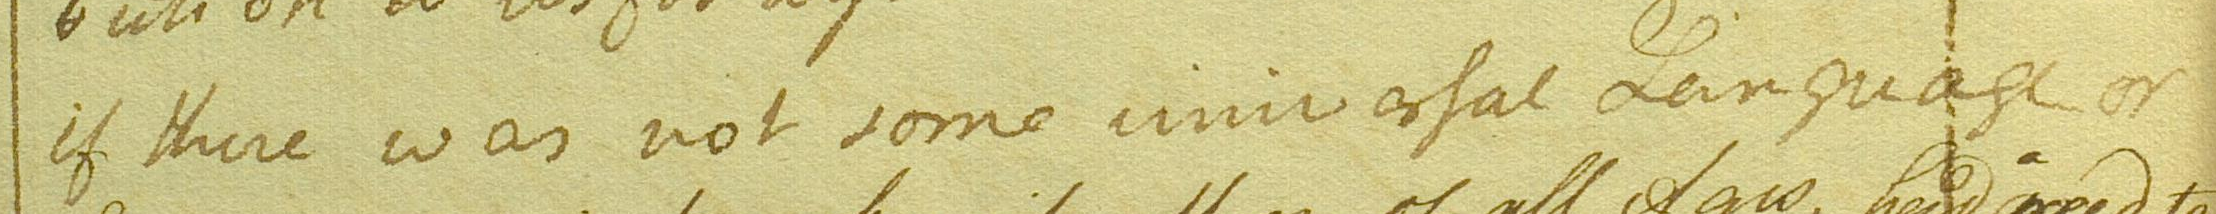if there was not some universal Language or
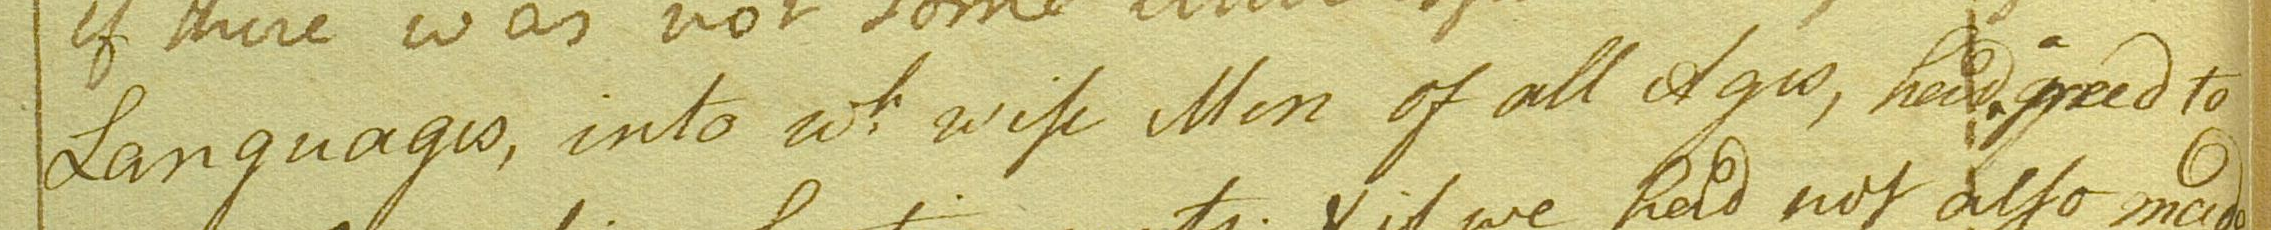Languages, into w^h. wise Men of all Ages, had ^a greed to
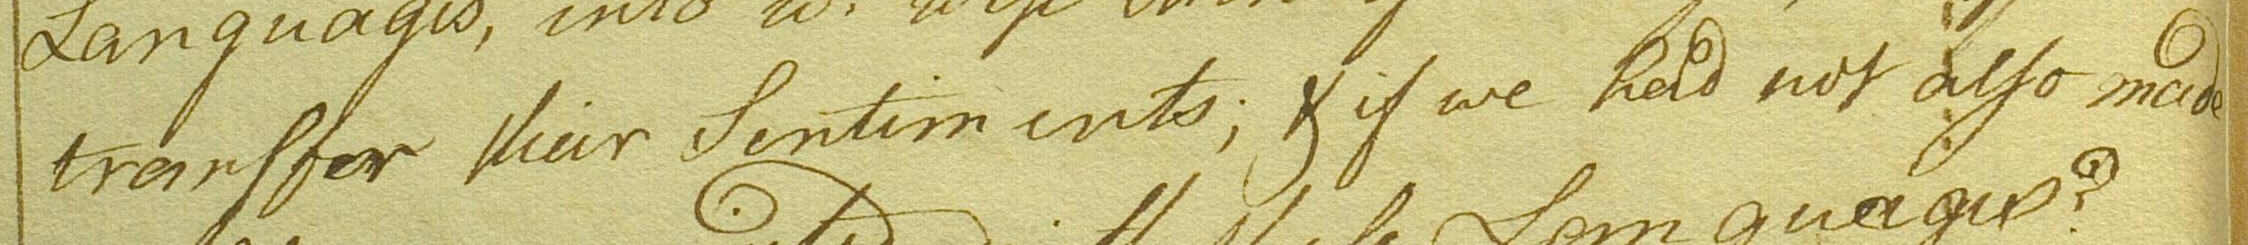transfer their Sentiments; & if we had not also made
